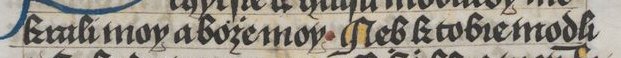krali moy a boże moy.Neb k tobie modli¬
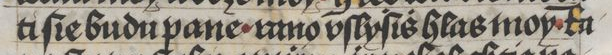ti ſie budu pane.rano uſlyẛíṡ hlas moy.Ra¬
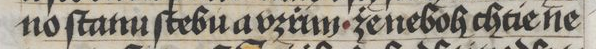no ſtanu ſtebu a uzṙím.že neboh chtie ne¬
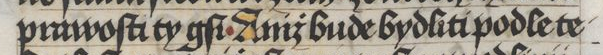prawoſti ty gſi.Aniż bude bydliti podle te¬
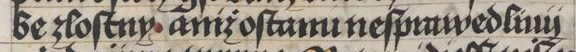be zloſtny.aniż oſtanu neſprawedlivij
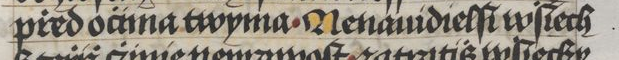pṙed oċima twyma.Nennawidielſi wẛiech
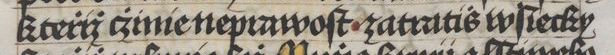kteṙíż cżinie neprawoſt.zatratíṡ wẛiecky
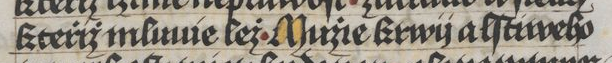kteṙíż mluvíe lež.Mużie krwij a lſtiweho
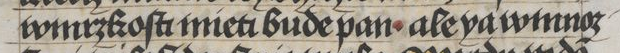wmrzkoſti mieti bude pan.ale ya w mnoz¬
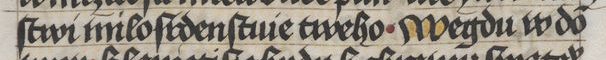ſtwi miloſrdenſtvie tweho.Wegdu w dō
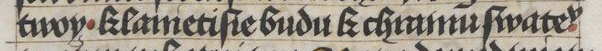twoy.klanietiſie budu k chramu ſwatev
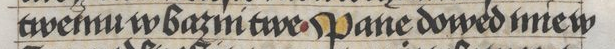twemu w bazni twe.Pane dowed mie w
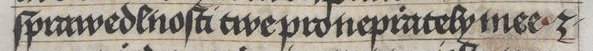ſprawedlnoſti twe pro nepṙately mee.z¬
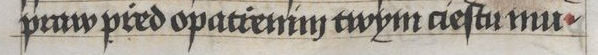praw pṙed opatṙením twym cieſtu mu.
